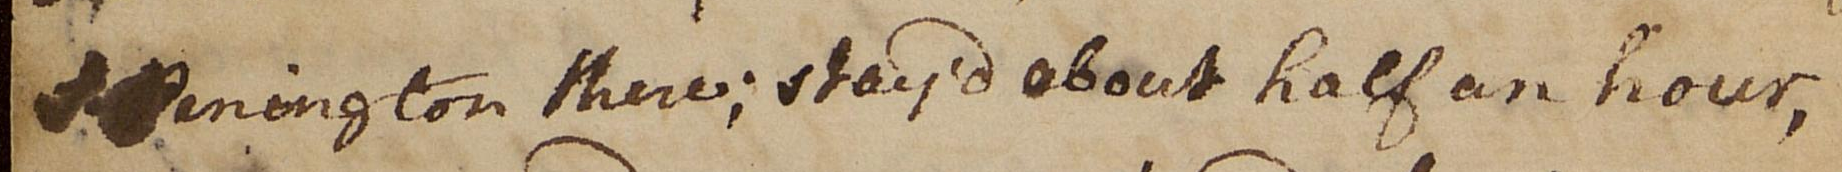S Penington there; stay'd about half an hour,
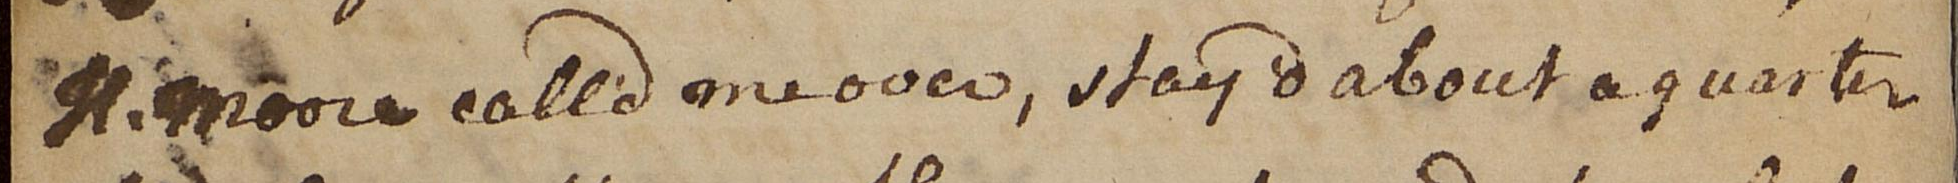H. Moore call'd me over, stay'd about a quarter
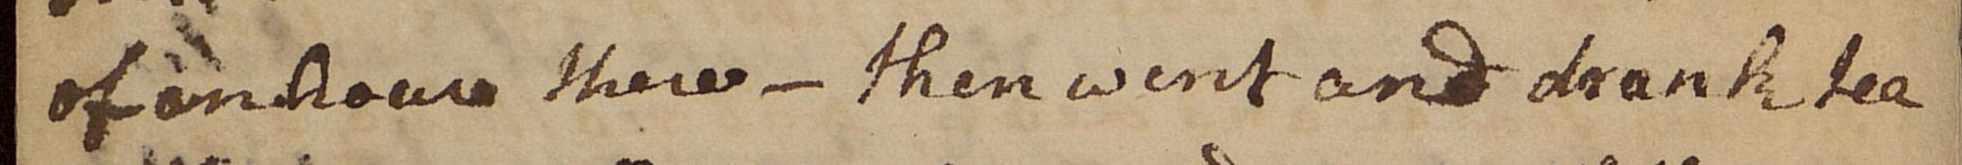of an hour there- Then went and drank tea
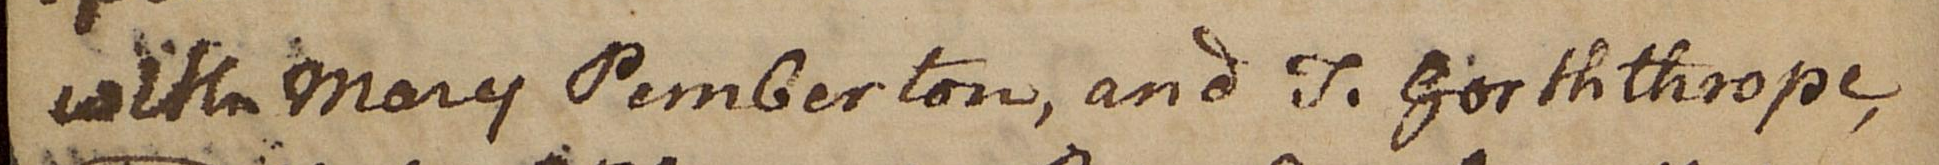with Mary Pemberton, and T. Gorththrope
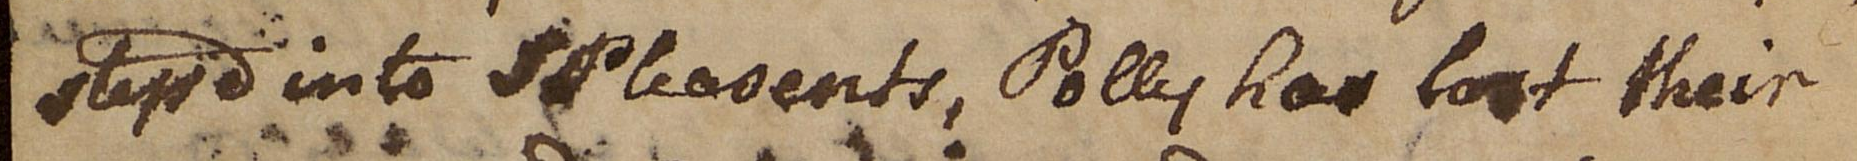step'd into S Pleasents, Polly has lost their
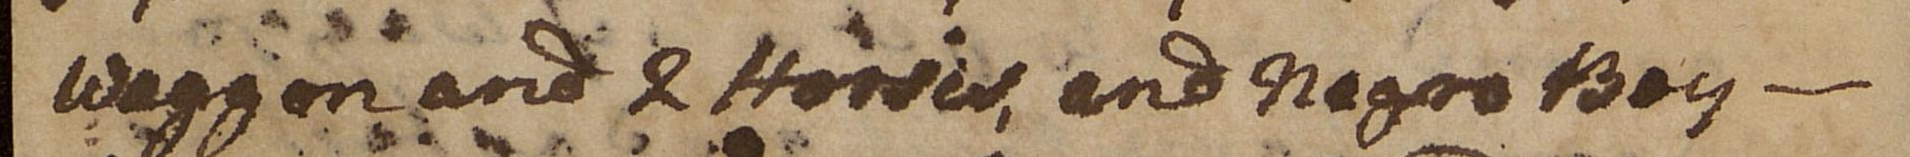waggon and 2 Horses, and Negro Boy-
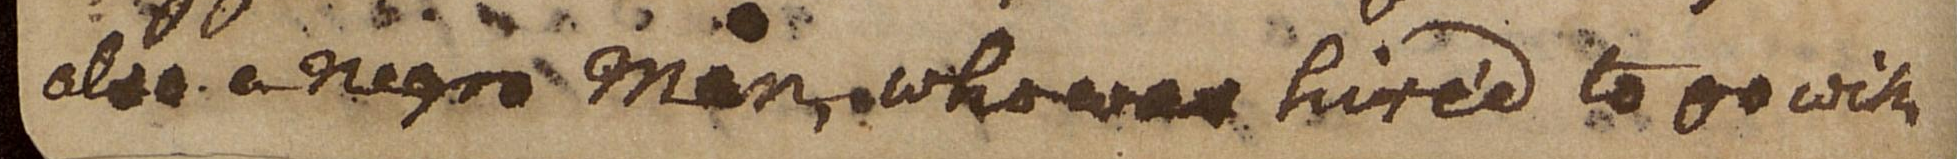also a Negro Man who was hire'd to go with
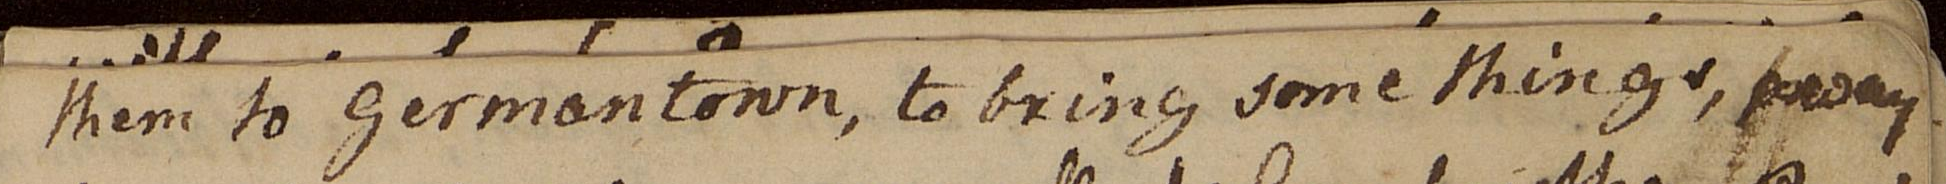them to Germantown, to bring some things, away
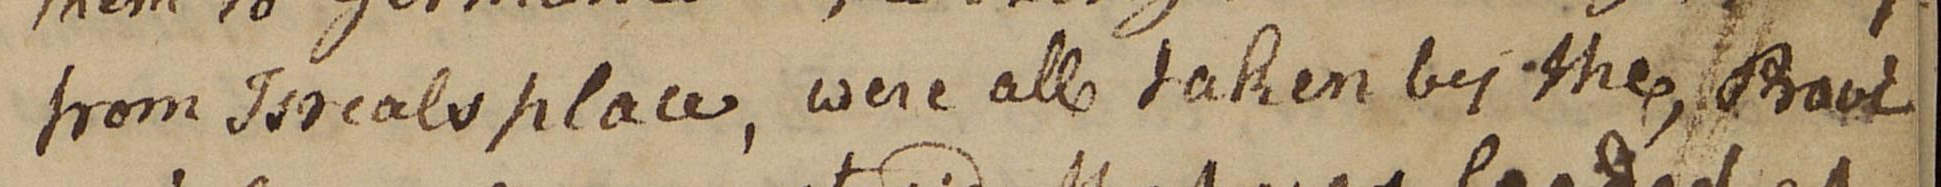from Isreals place were all taken by the, Provi
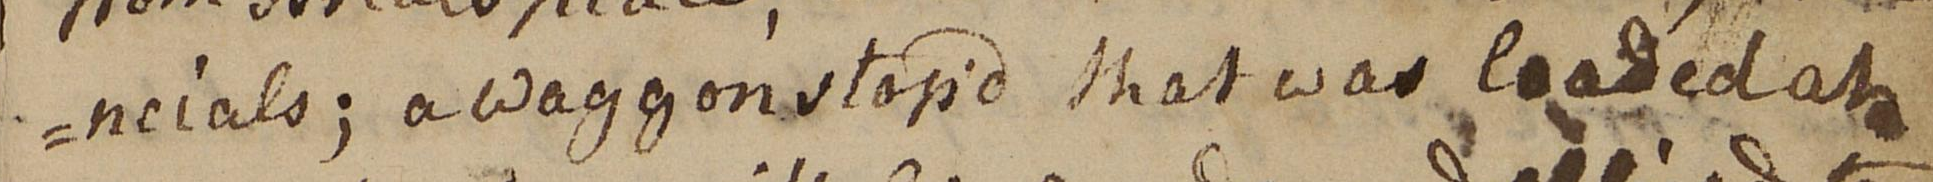-ncials; a Waggon stop'd that was loaded at
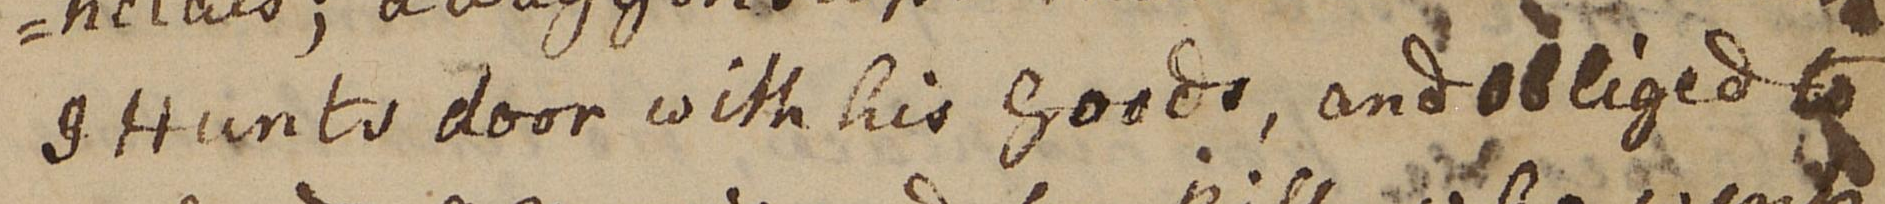J Hunts door with his Goods, and obliged to
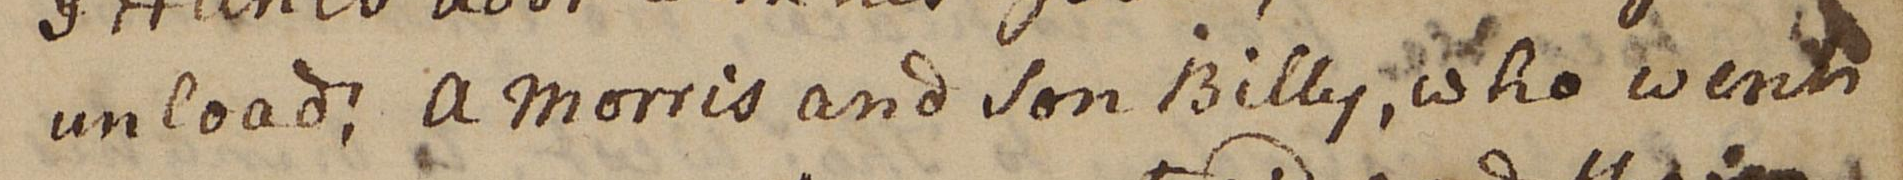unload, A Morris and son Billy, who went
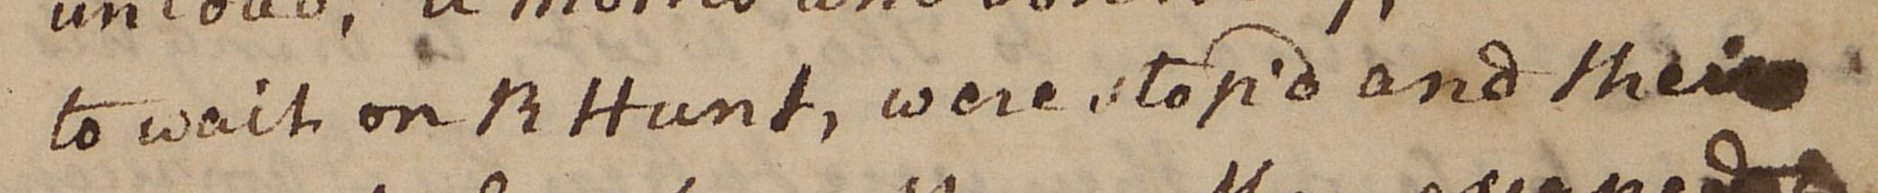to wait on R Hunt, were stop'd and their
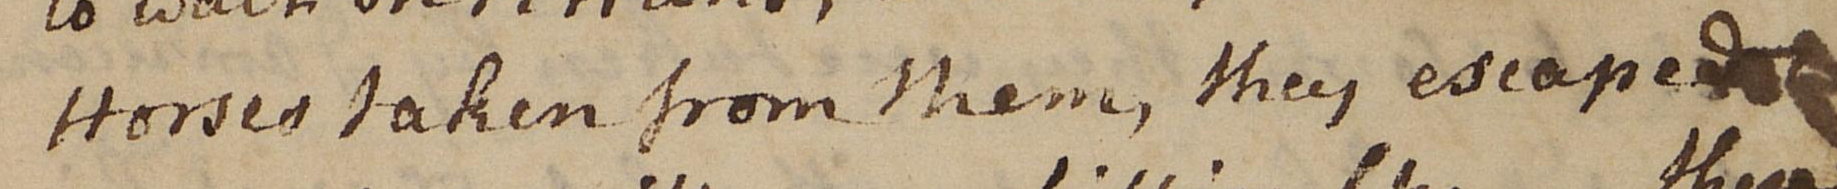Horses taken from them, they escaped
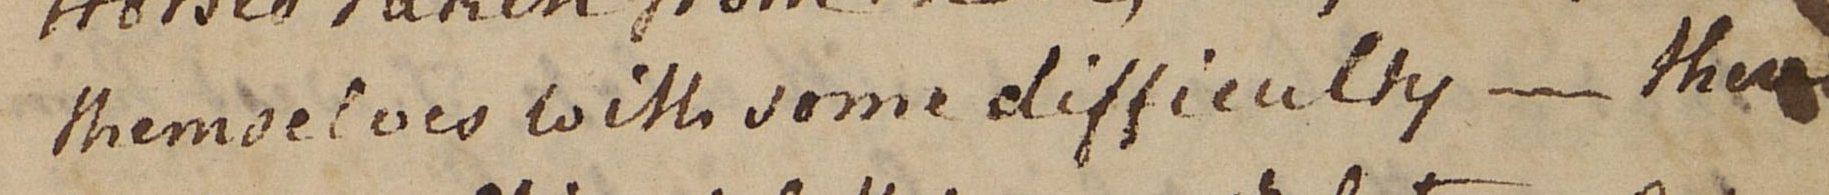themselves with some difficulty- there
